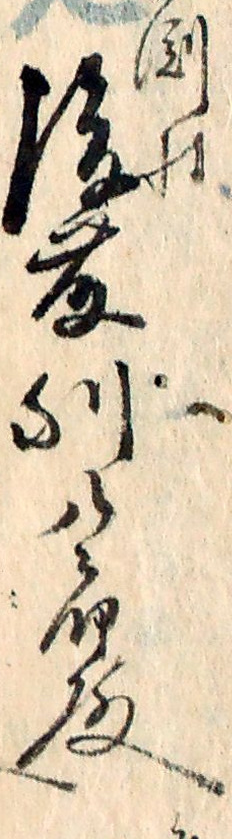後藤利八郎
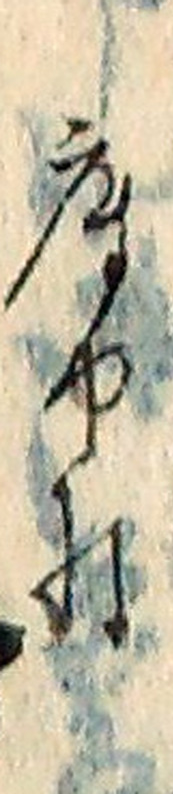府中村
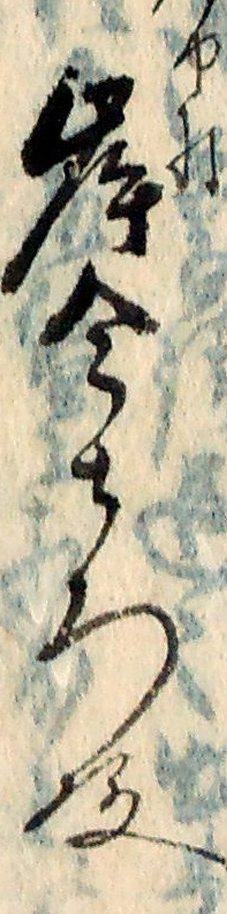岸金右衛門殿
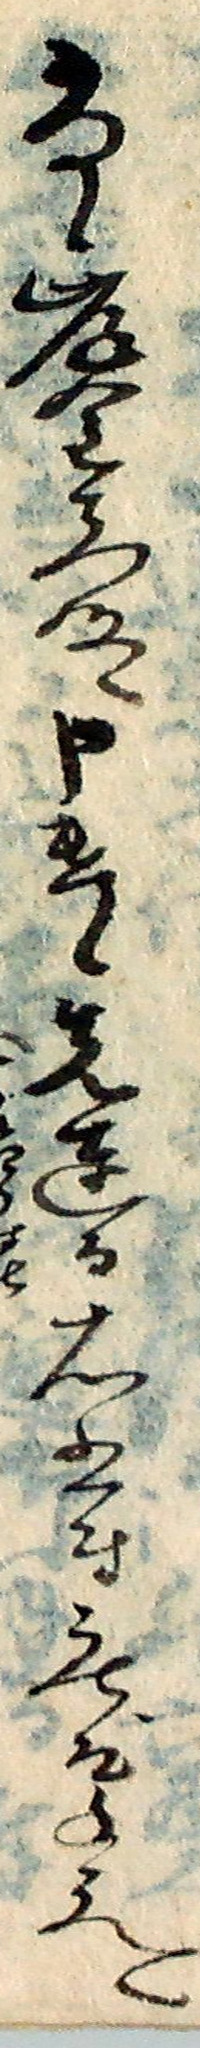尚々岸金右衛門殿へ申継候先達て右書付庄屋手元へ
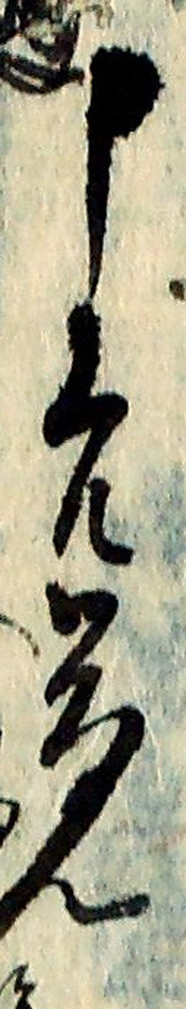申上る覚
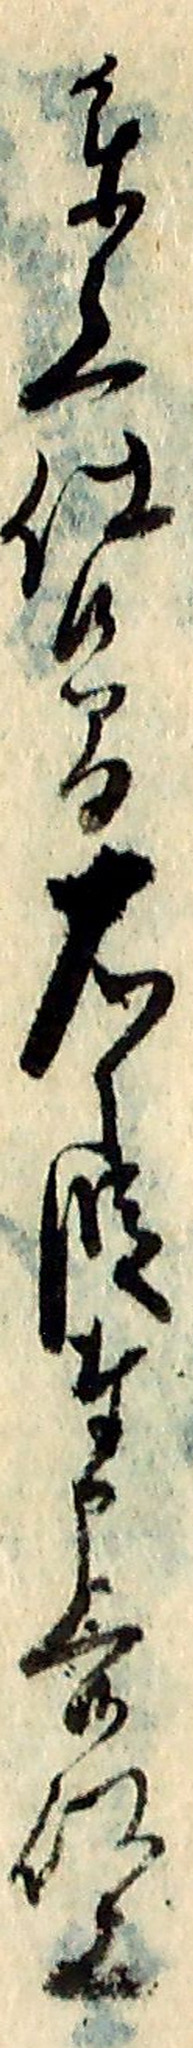参上仕候間右之段奉申上候以上
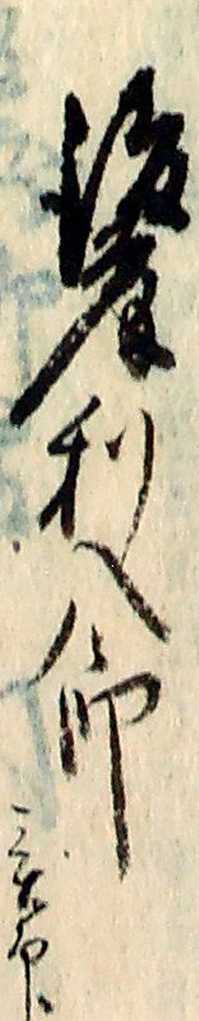後藤利八郎
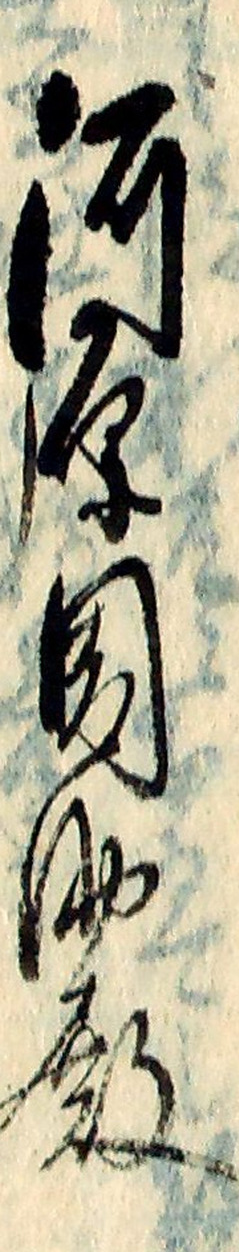河原周助殿
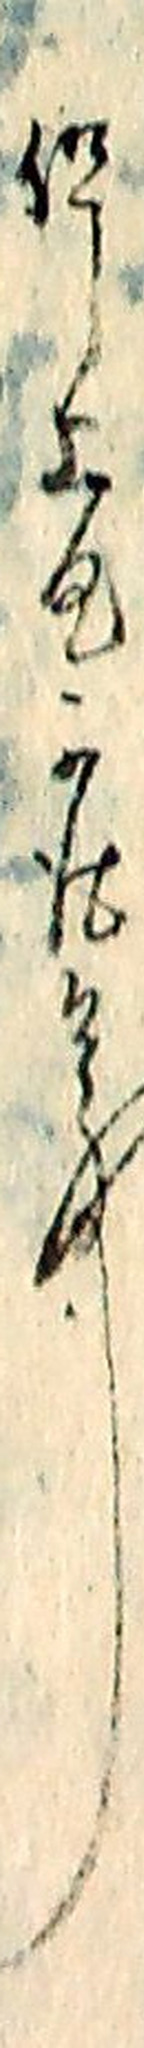但し上包可仕候事
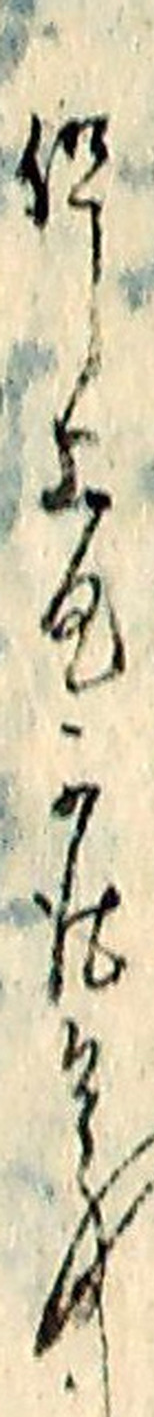但し上包可仕候事
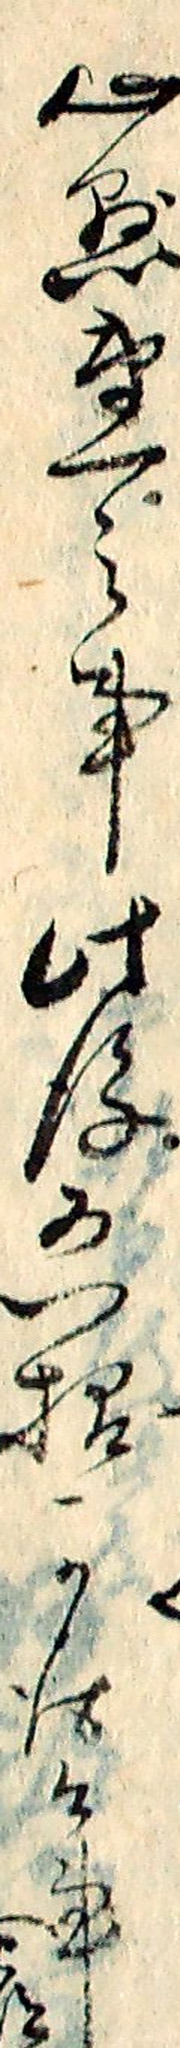心懸専一之事此後右様可仕候事
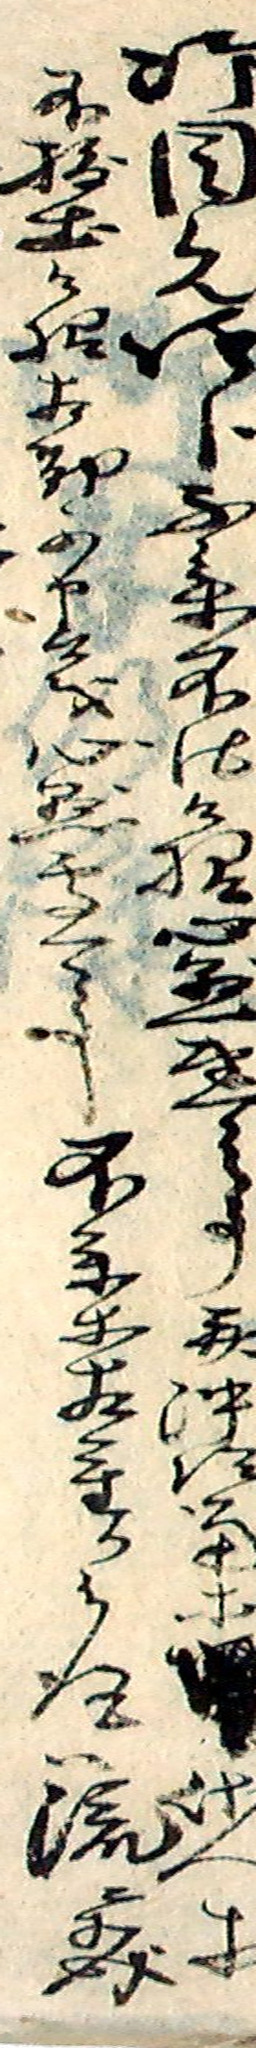不指出候様相勤可申候義心懸専一之事不参等相重り候得は流に相成
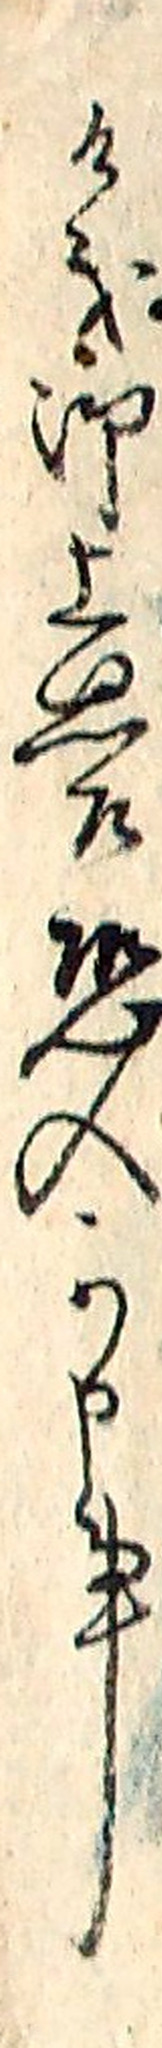候義御上思召恐入可申事

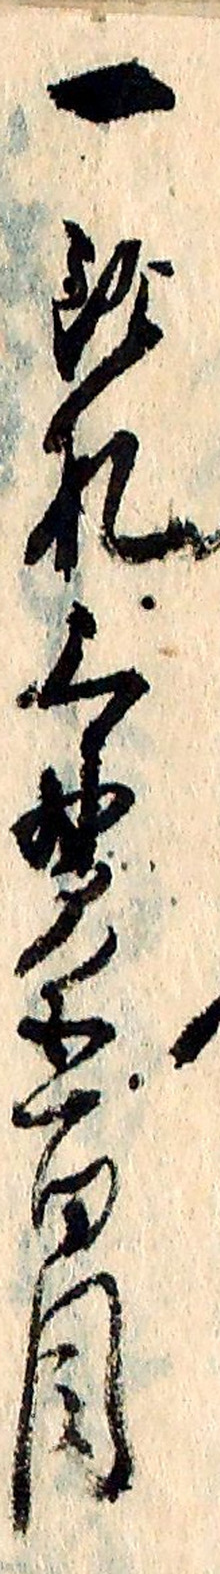一銀札三貫五百目
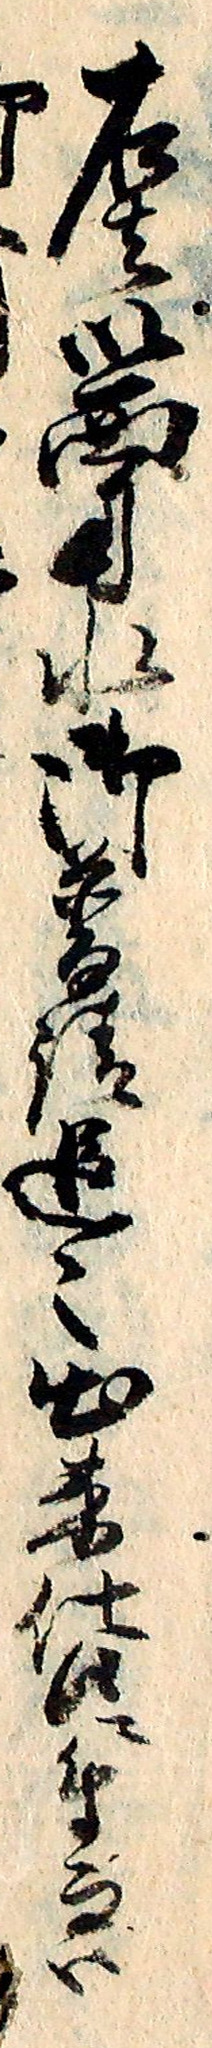右は以西用水御普請追々出来仕候に付ては
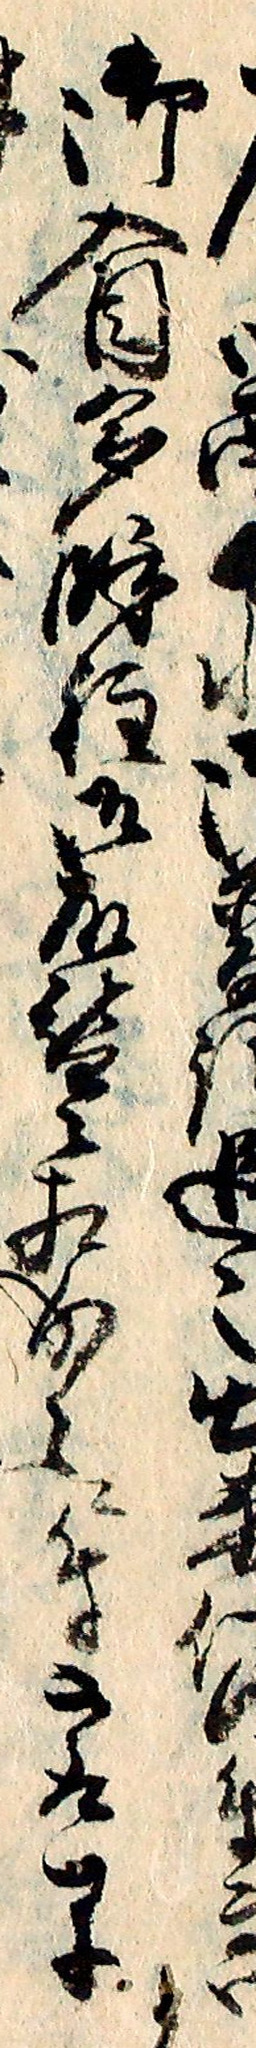御入目多余程御取替に相成候に付最早
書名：諸御願書控(後藤氏壱番）
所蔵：鳴門教育大学 Naruto University of Education
